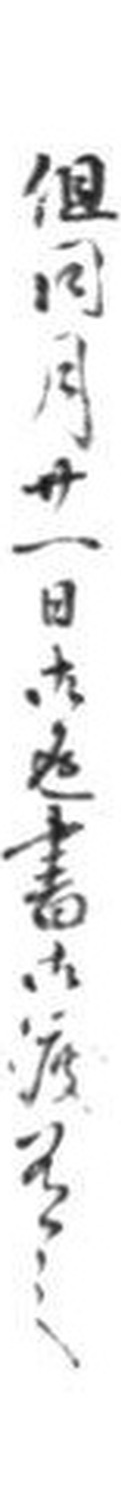但同月廿一日御返書御渡有之
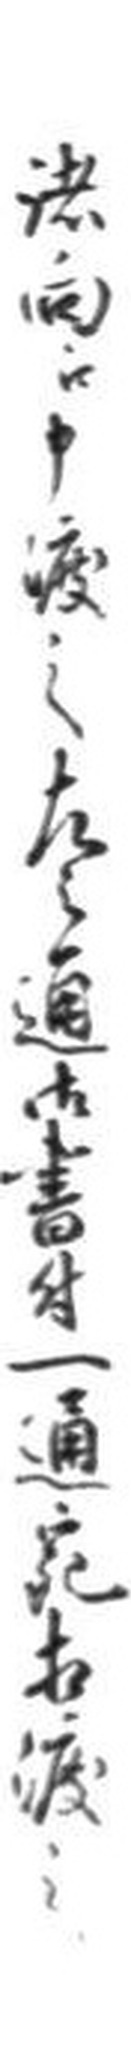諸向江申渡之左之通御書付一通宛相渡之
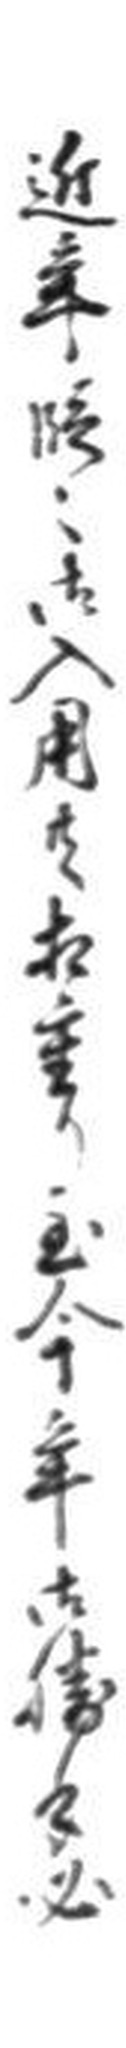近年段々御入用共相重り至今年御勝手必
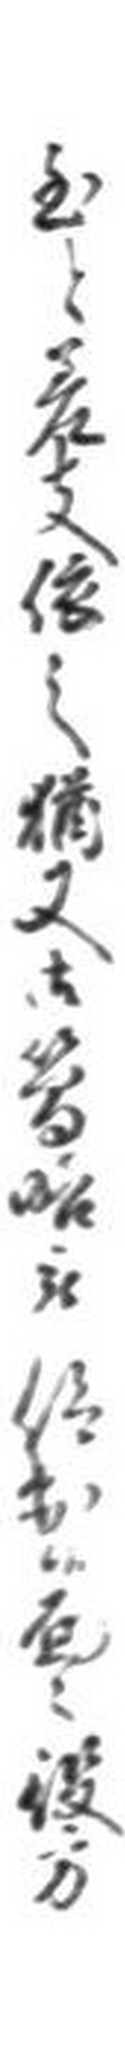至と差支依之猶又御簡略被仰出候面々役方
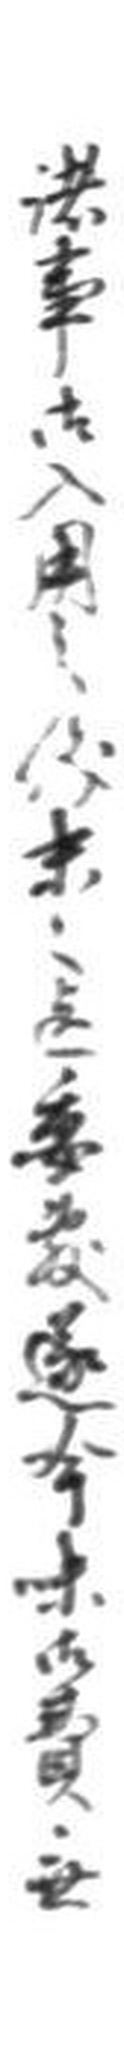諸事御入用之儀末々迄委敷遂吟味御費無
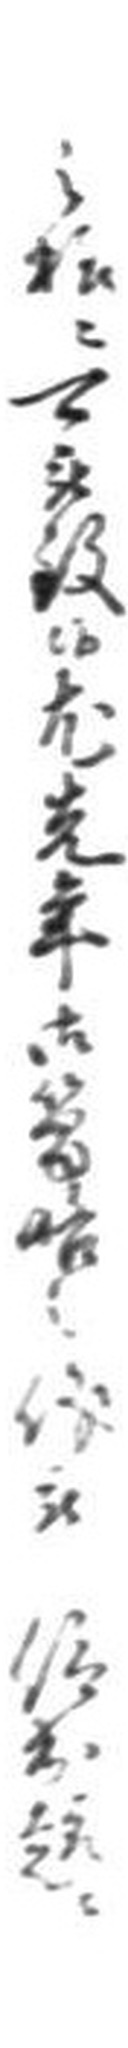之様ニ可被致候尤先年御簡略之儀被仰出趣ニ
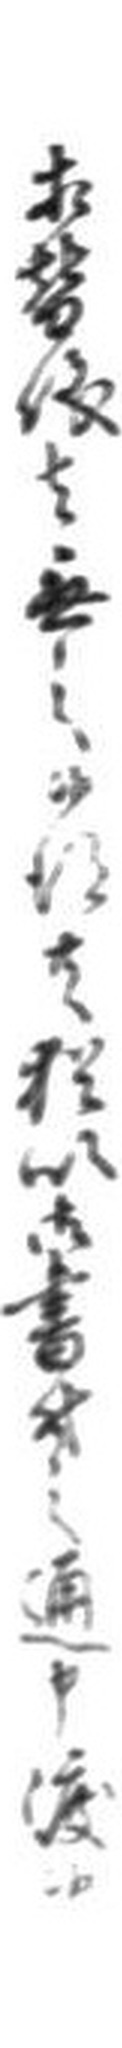相替儀者無之候得共猶以御書付之通申渡候
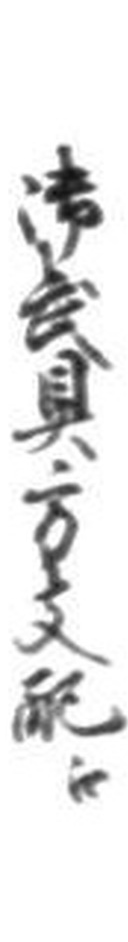御武具方支配江
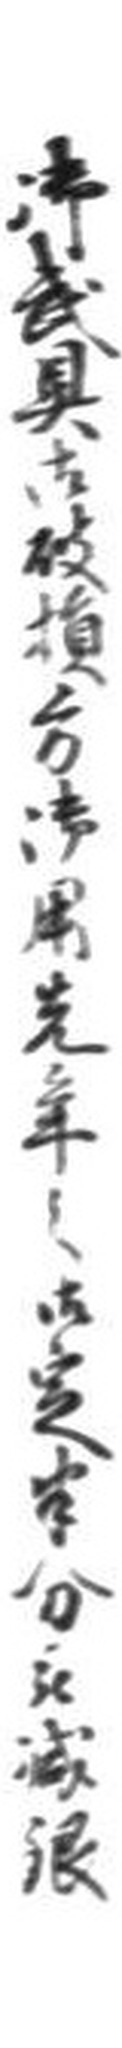御武具御破損方御用先年之御定半分被減銀

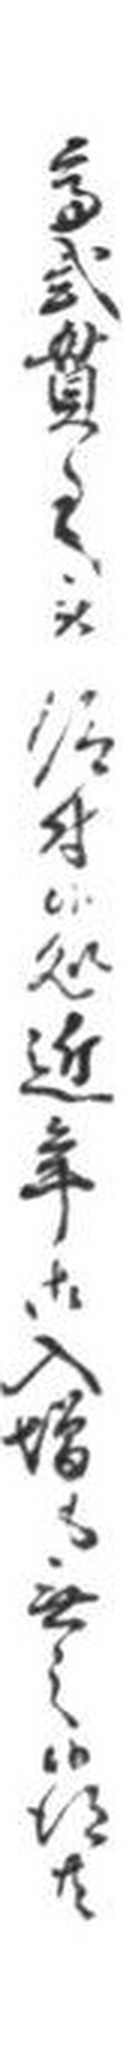高弐貫匁被仰付候処近年御入増も無之候得共
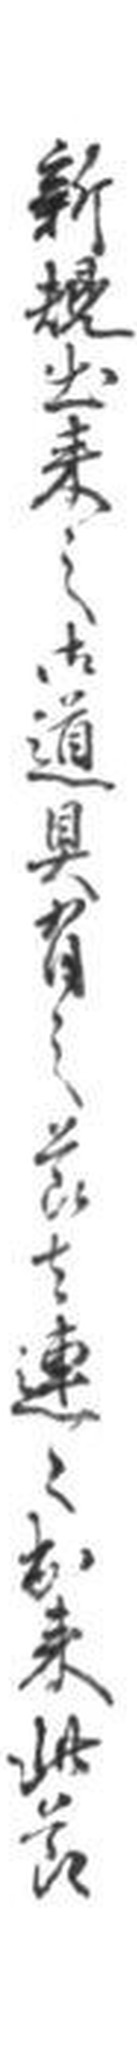新規出来之御道具有之節者連々出来此節
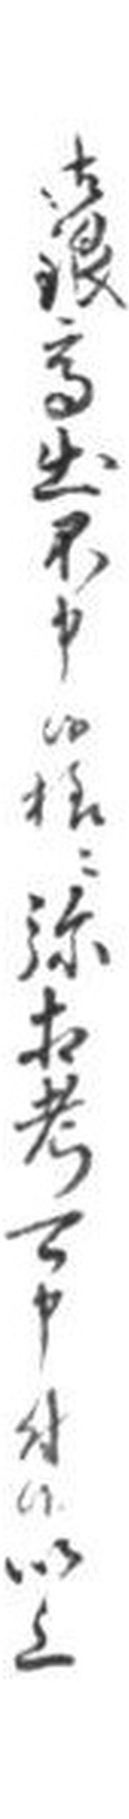御銀高出不申候様ニ弥相考可申付候以上
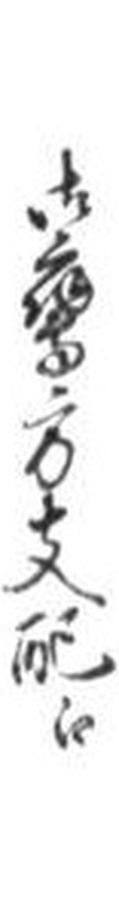御鷹方支配江
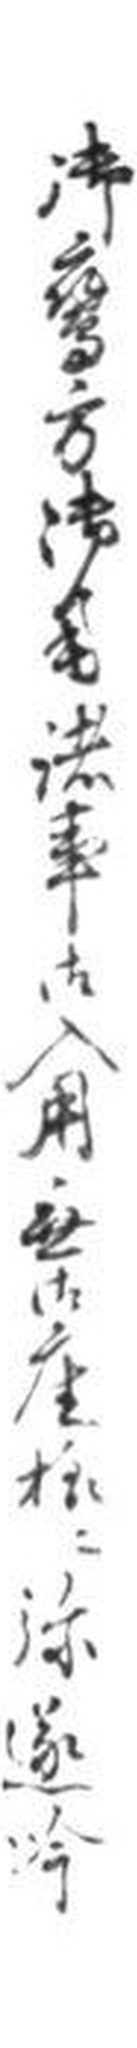御鷹方御用諸事御入用無御座様ニ弥遂吟
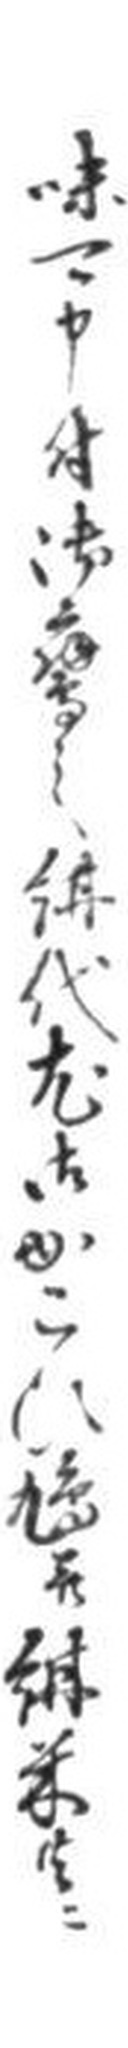味可申付御鷹之餌代尤御かこひ鳩并餌米共ニ
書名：家譜 二十二 吉品公 従元禄十五年到同十六年
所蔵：福井県文書館 Fukui Prefectural Archives
